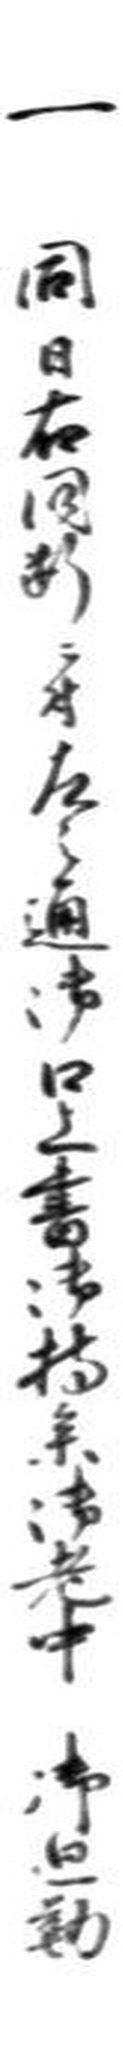一同日右同断ニ付左之通御口上書御持参御老中御廻勤
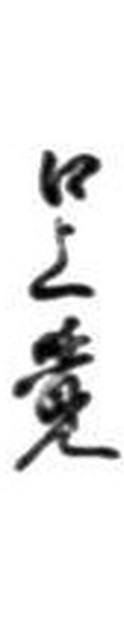口上覚
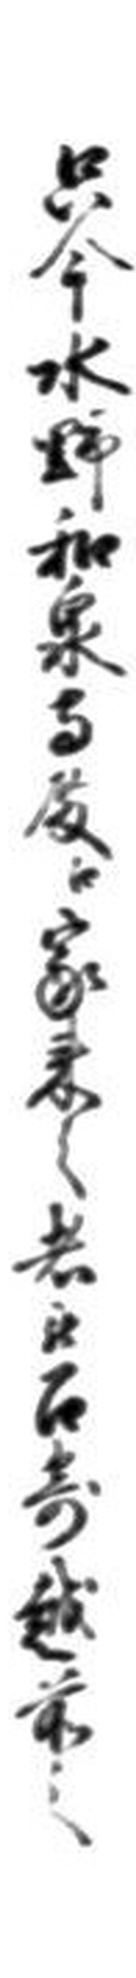只今水野和泉守殿江家来之者被召寄越前之
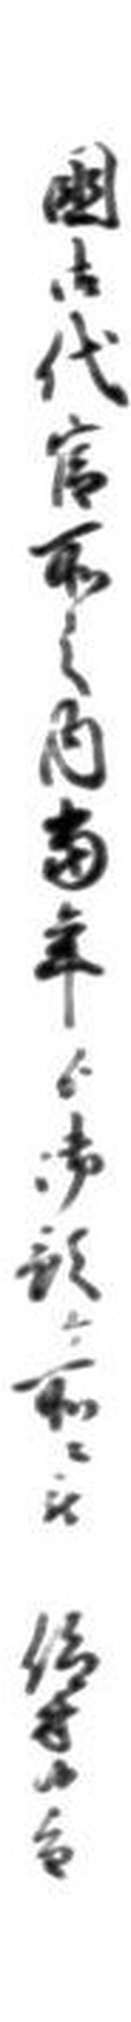国御代官所之内当年ゟ御預ケ所ニ被仰付候旨
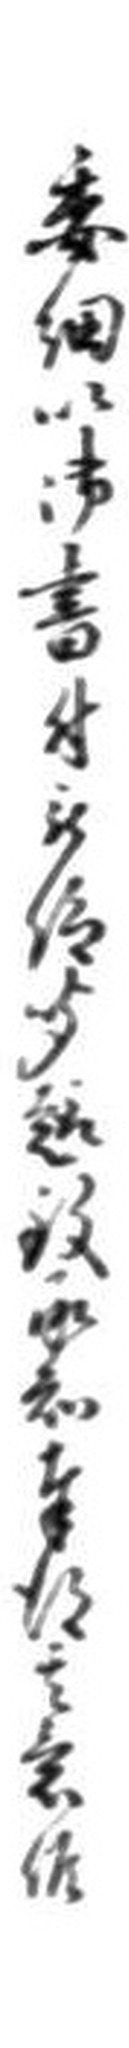委細以御書付被仰聞趣致承知奉得其意候
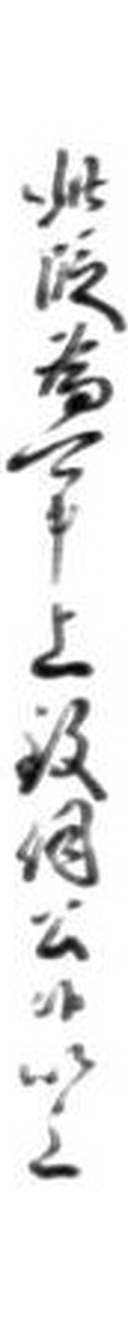此段為可申上致伺公候以上
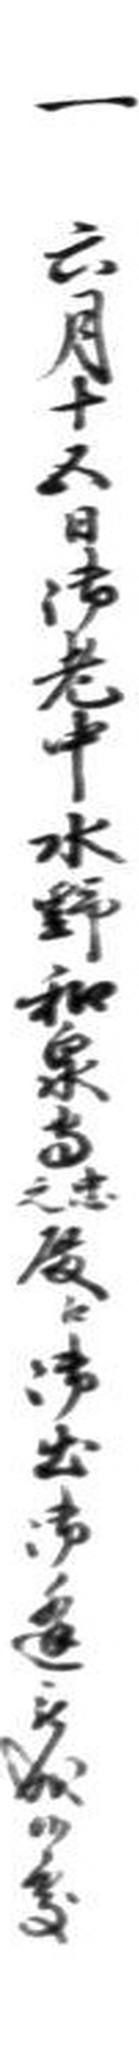一六月十五日御老中水野和泉守忠之殿江御出御逢被成候処
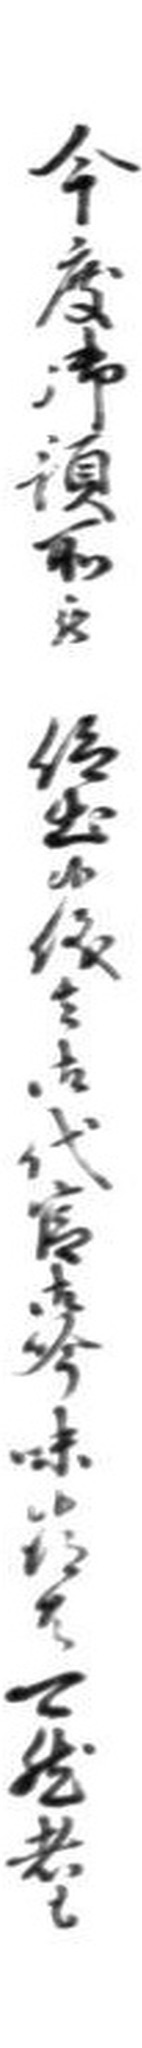今度御預所被仰出候儀者御代官御吟味候得共可然者も

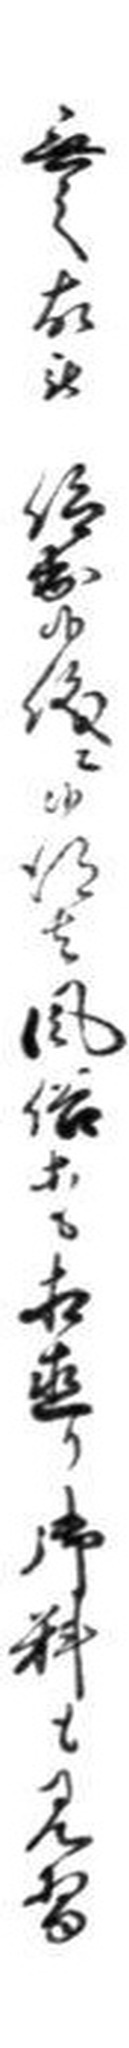無之故被仰出候儀ニ候得者風俗等も相直り御料も見習
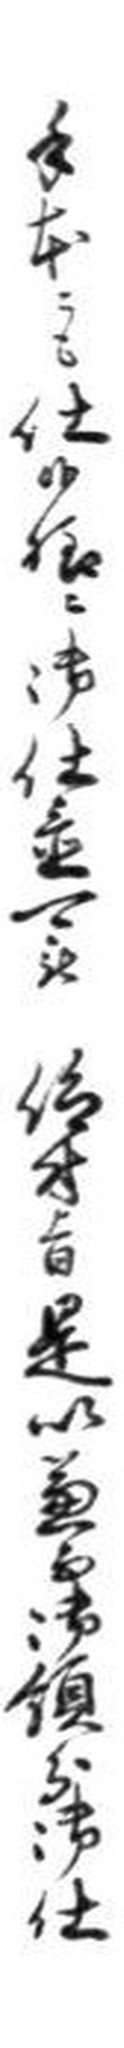手本ニも仕候様ニ御仕置可被仰付旨是以兼而御領分御仕
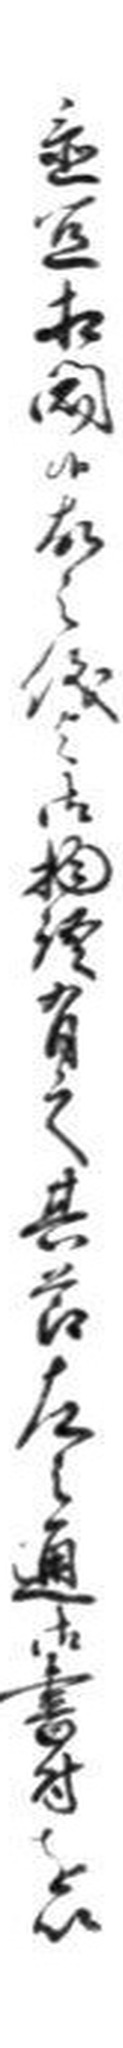置宜相聞候故之儀与御物語有之其節左之通御書付を以
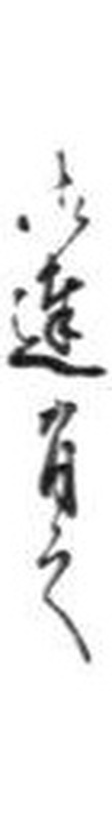御達有之
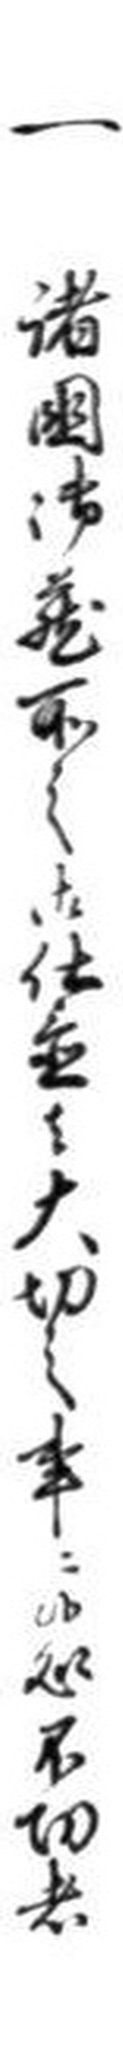一諸国御蔵所之御仕置者大切之事ニ候処不功者
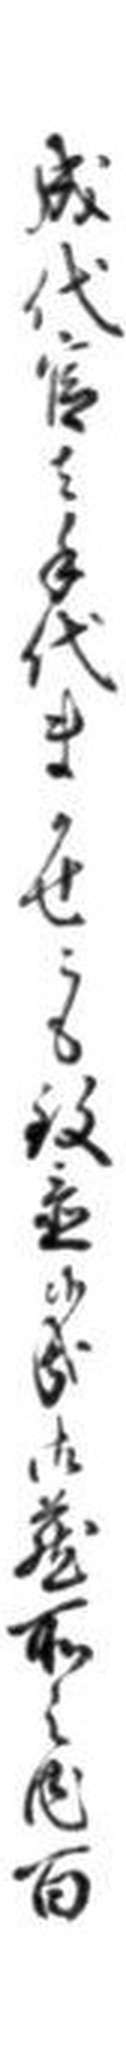成代官者手代まかせニも致置候哉御蔵所之内百
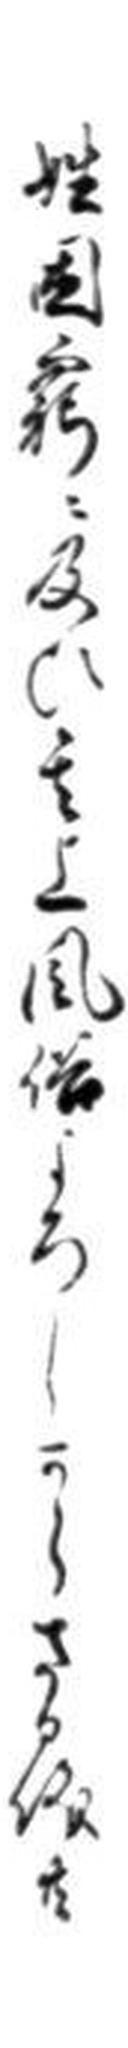姓困窮ニ及ひ其上風俗よろしからさる儀共
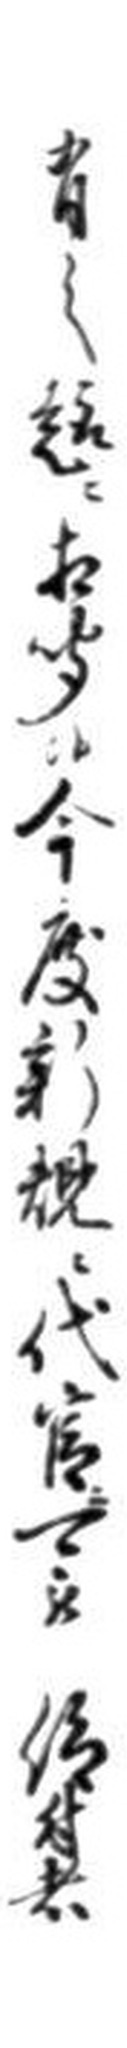有之趣ニ相聞候今度新規ニ代官可被仰付者
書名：家譜 三十四 吉邦公 従享保五年到同六年
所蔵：福井県文書館 Fukui Prefectural Archives
